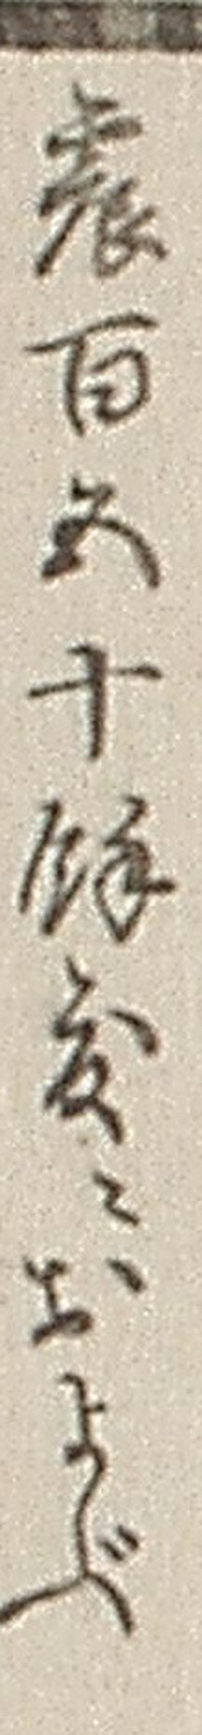震百五十餘度におよぶ

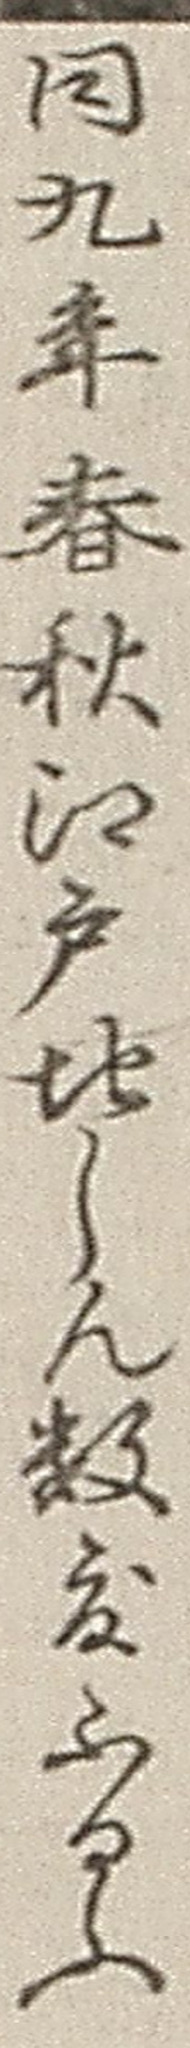同九年春秋江戸地しん数度ふるふ
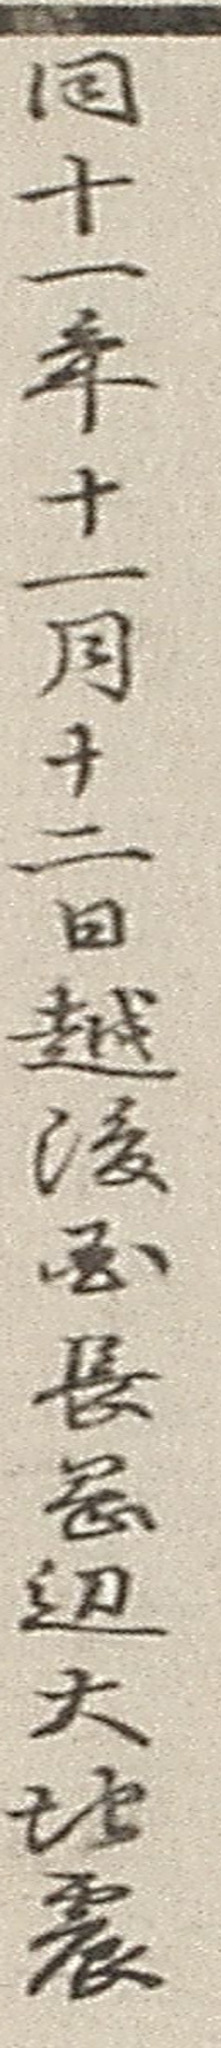同十一年十一月十二日越後国長岡辺大地震
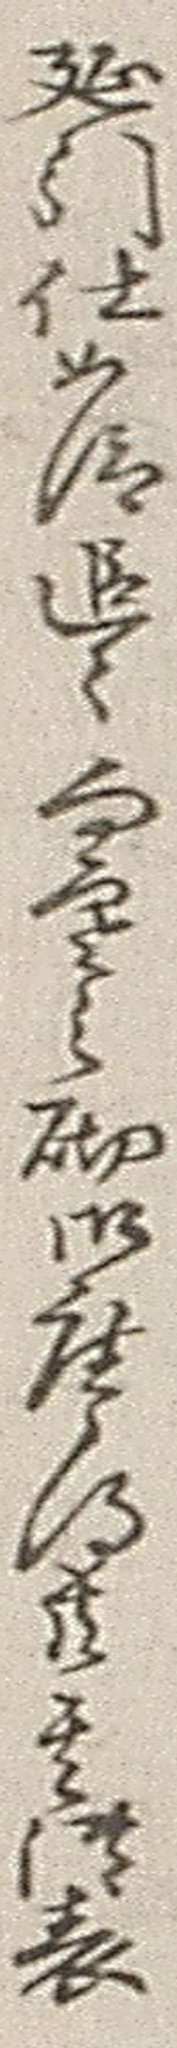延引仕如治追々向寒之砌御座候得共其御表
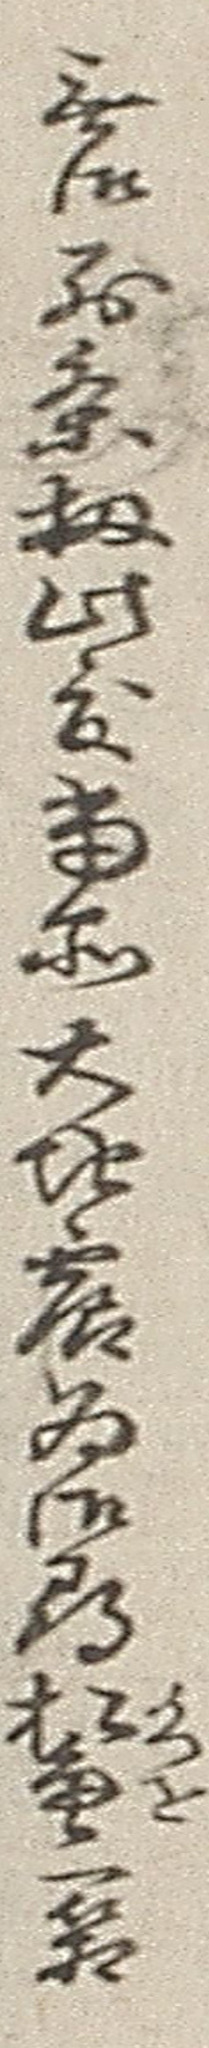無御別条扨此度当所大地震為御尋松魚一箱

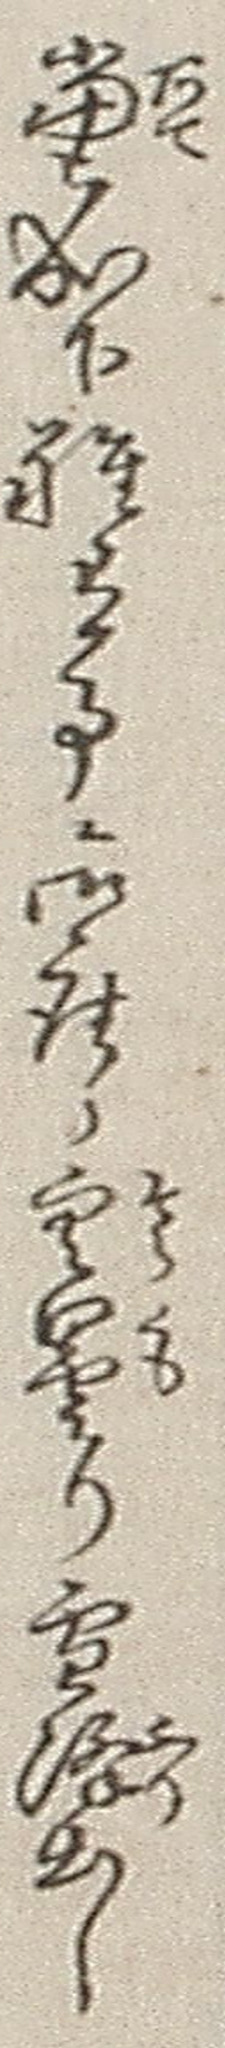当被成下難有事ニ御座候空曇り雪降出し
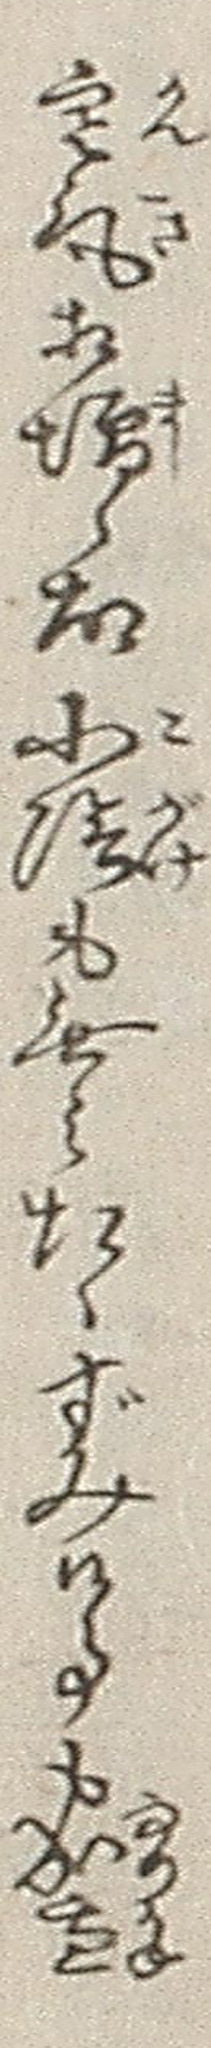寒気相増候故木陰も無之たゝずみ候事も成兼
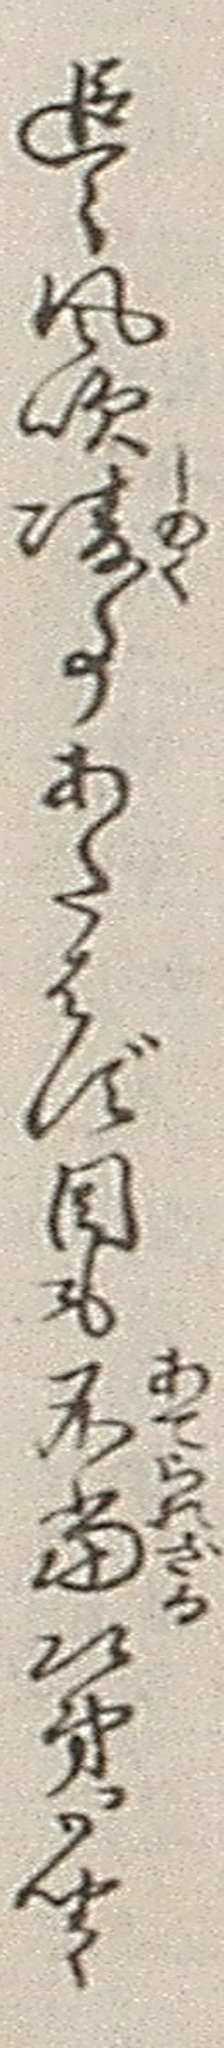追々風吹凌事あたはず目も不当次第ニ御座候
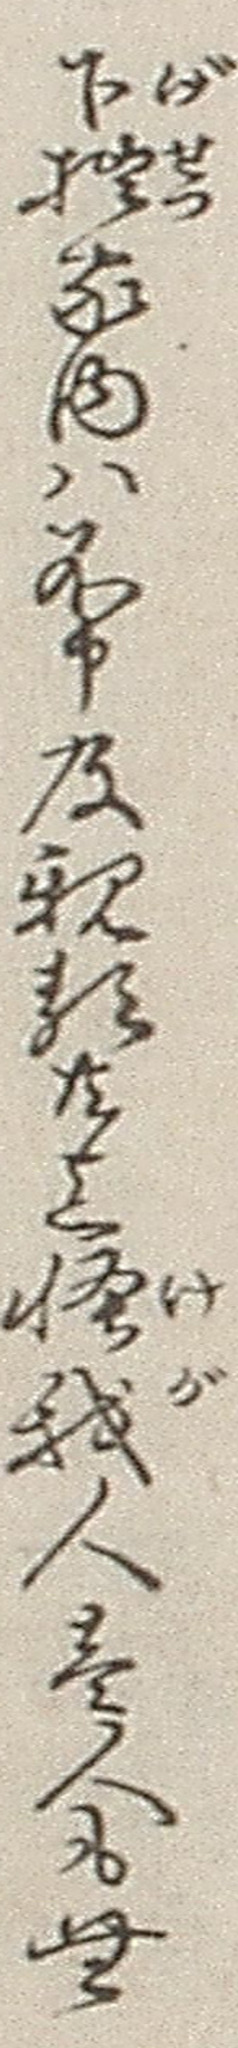下拙家内は不申及親類共迄怪我人壱人も無
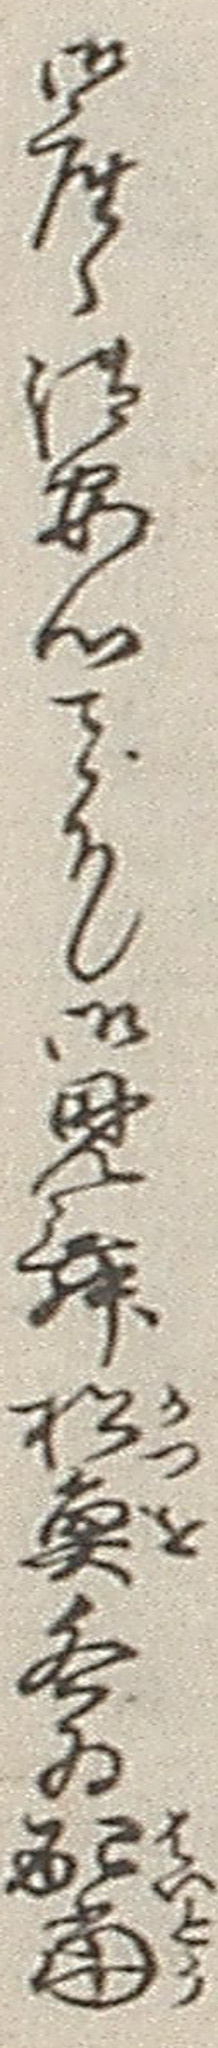御座候御安心可被下候御見舞松魚冬為配当
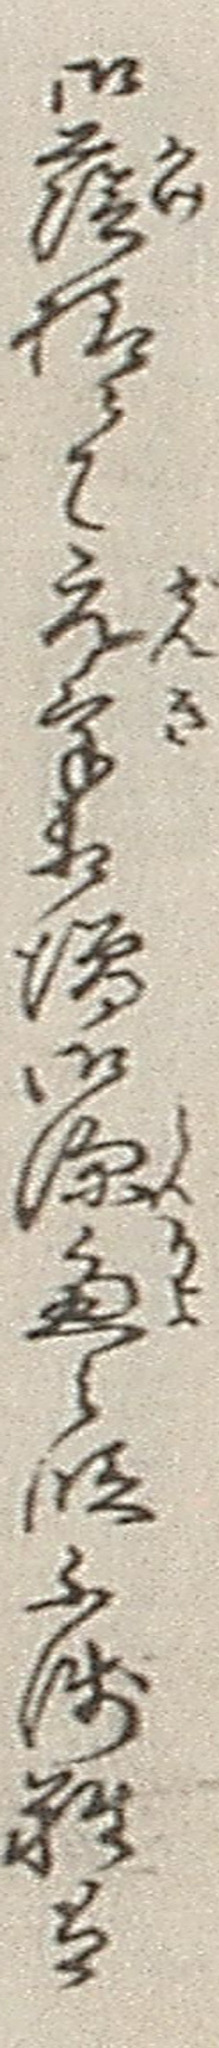御蔭様二て元気相増御深慮之段不残難有

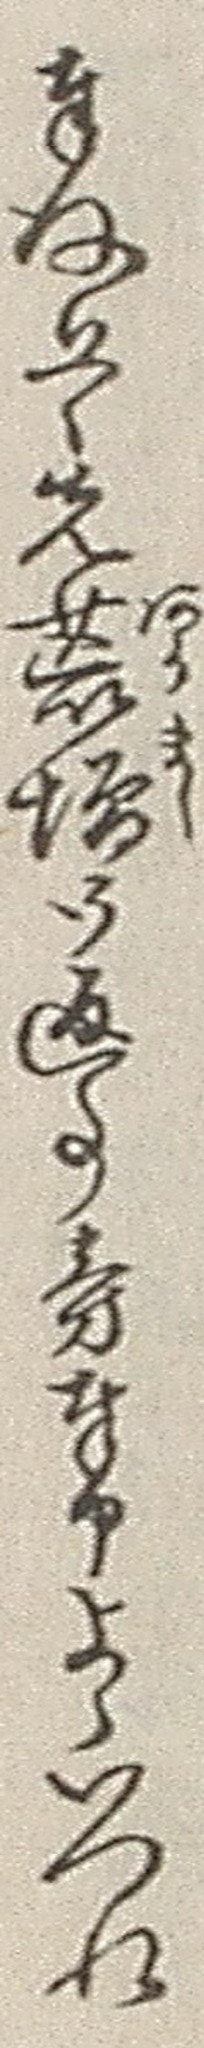奉存上候先荒増御返事旁奉申上候いつれ
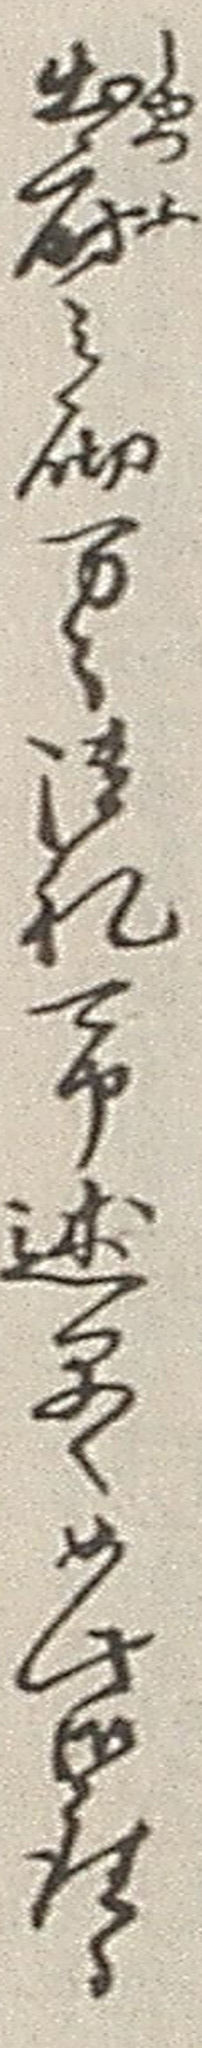出府之砌万々御礼可申述早〻如此御座候
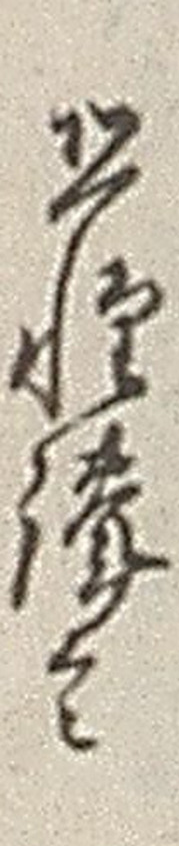恐惶謹言
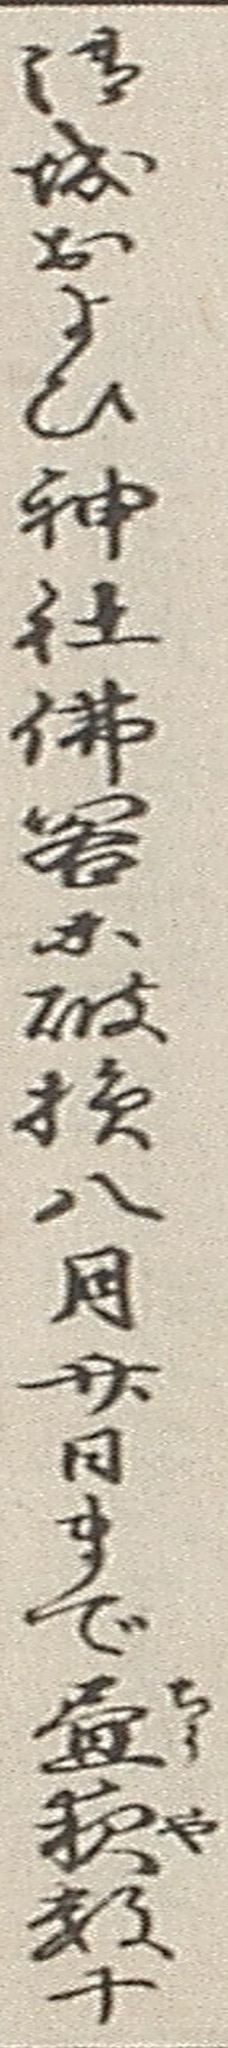御城およひ神社仏閣等破損八月廿日まで昼夜数十
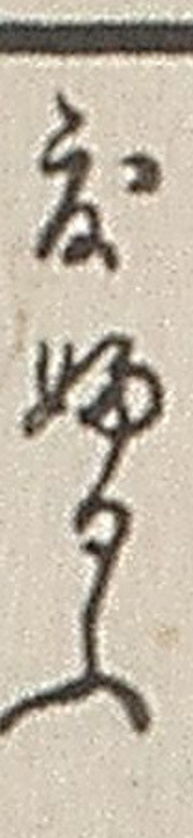度ふるふ
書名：大地震暦年考　全
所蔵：東京大学地震研究所図書室 Earthquake Research Institute Library, The University of Tokyo, JAPAN
